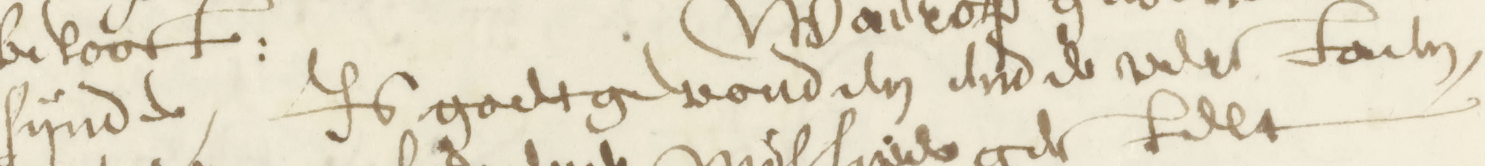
sijnde, Is goetgevonden ende verstaen,
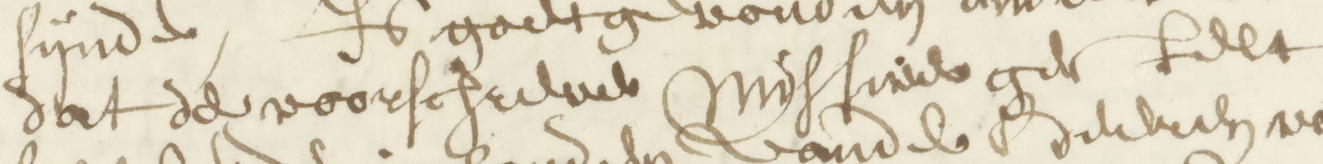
dat de voorschreve missive gestelt
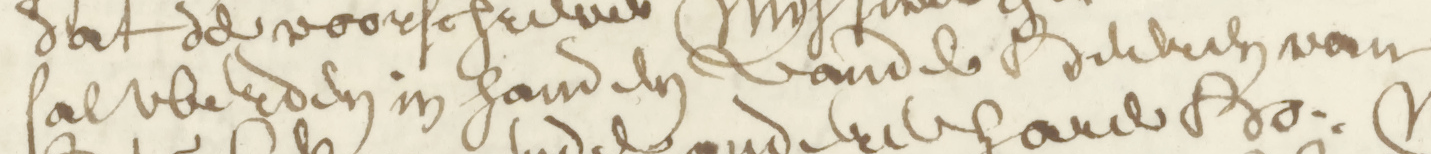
sal werden in handen vande Heeren van
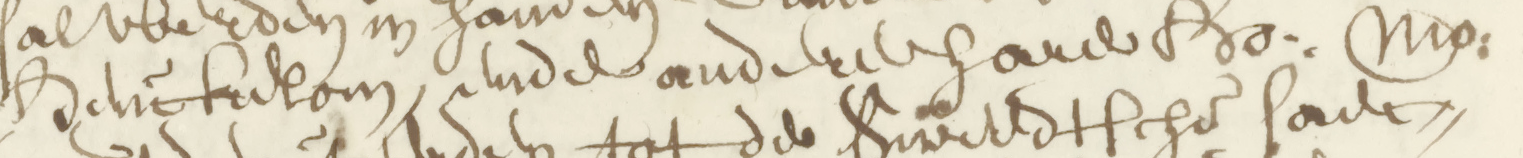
Heuckelom, ende andere hare Ho:Mo:
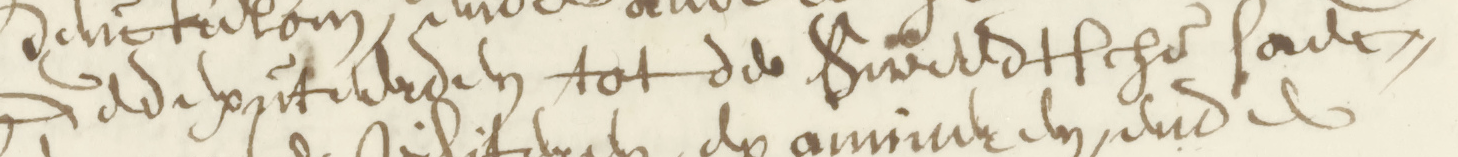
Gedeputeerden tot de Sweedtsche saec„
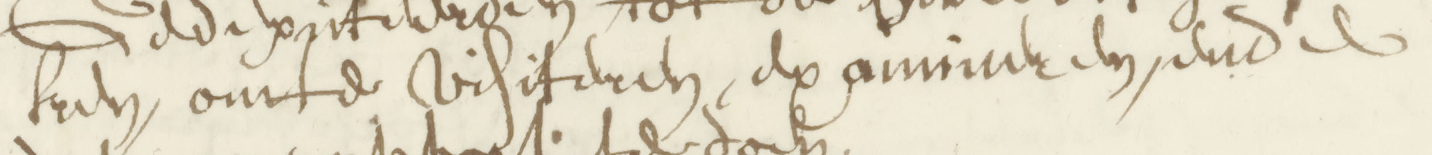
ken, om te visiteren examineren, ende
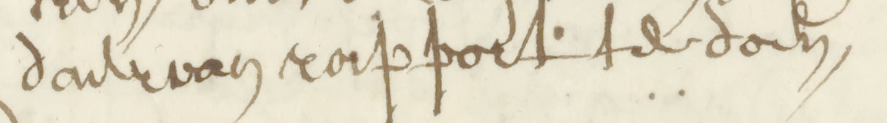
daervan rapport te doen.
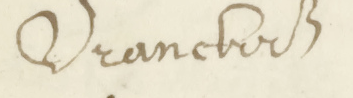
Vranckr
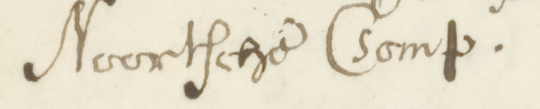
Noortsche Compe.
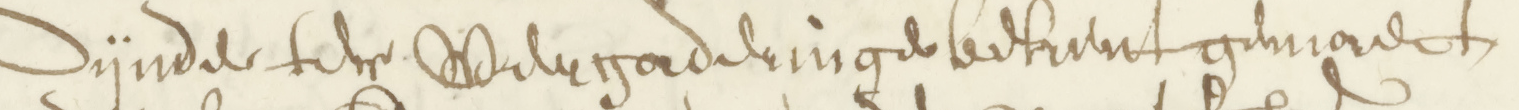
Sijnde ter Vergaderinge bekent gemaect,
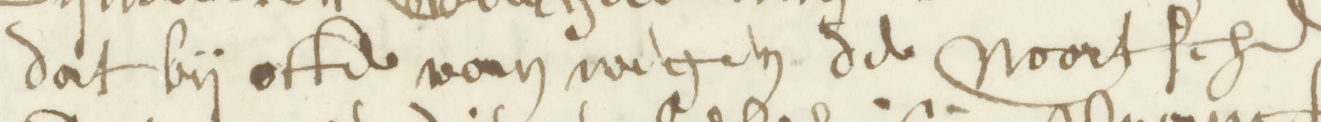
dat bij ofte van wegen de Noortsche
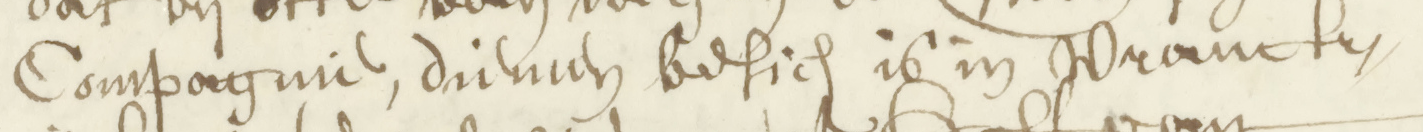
Compagnie, diennen besich is in Vranck,
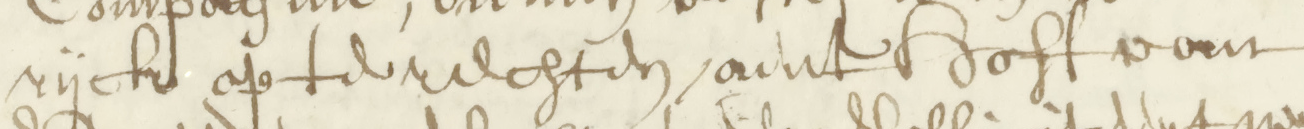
rijck opte rechten, aent Hoff van
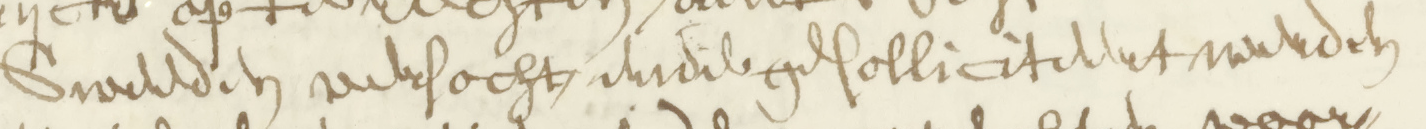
Sweeden versocht, ende gesolliciteert werden
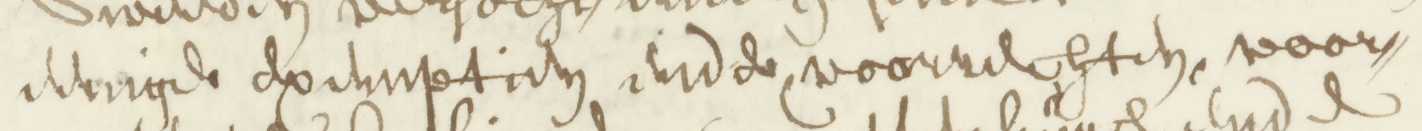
eenige exemptien ende voorrechten, voor,,
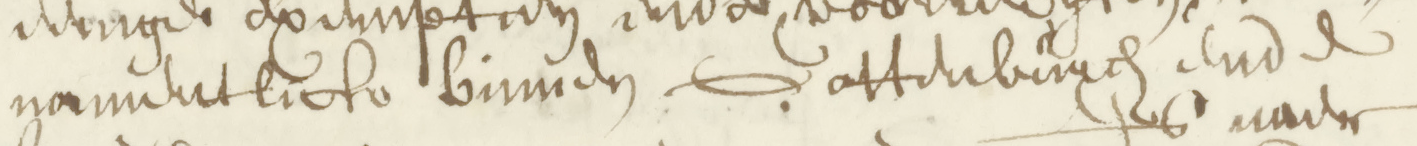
namentlick binnen Gottenburch ende
